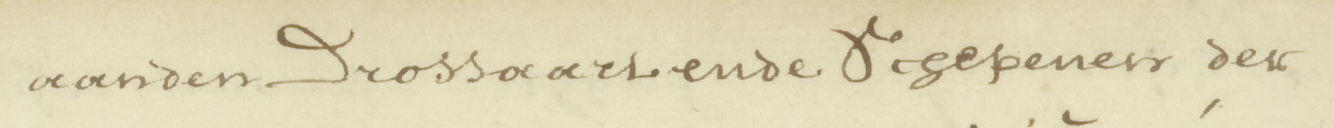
aanden Drossaart ende Schepenen der
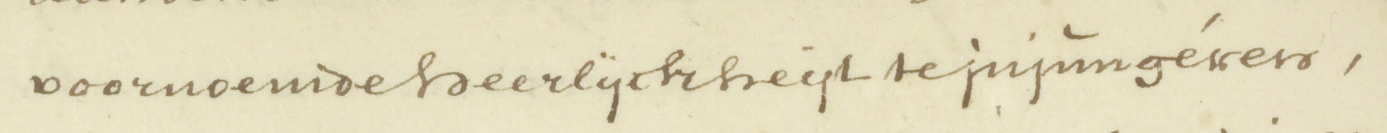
voornoemde heerlijckheijt te injungeren,
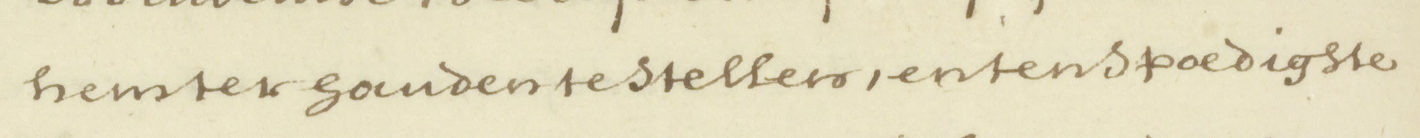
hem ter handen te stellen, en ten spoedigste
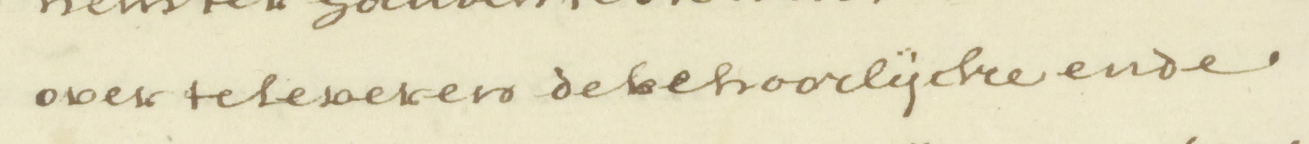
over te leveren de behoorlijcke ende
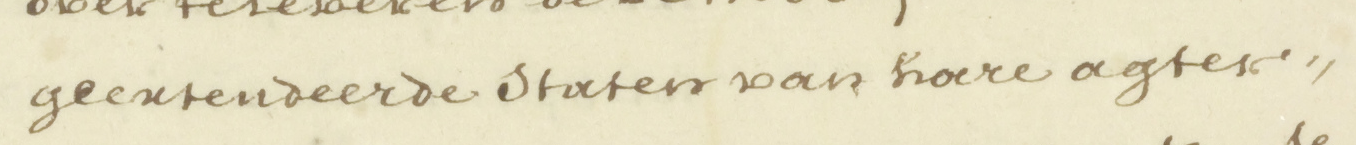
geextendeerde staten van hare agter„
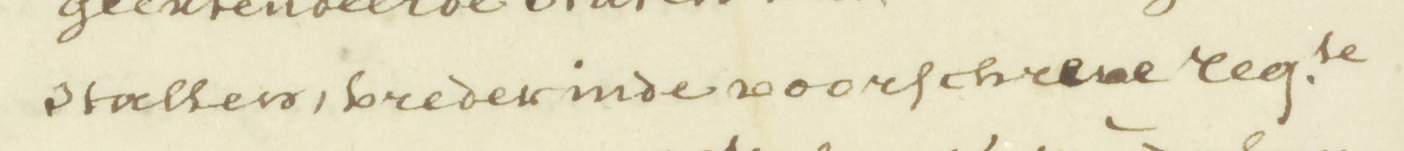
stallen, breder inde voorschreve reqte
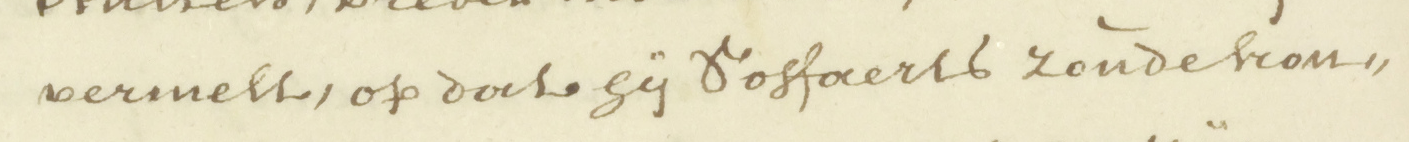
vermelt, op dat hij Sossaerts zoude kon„
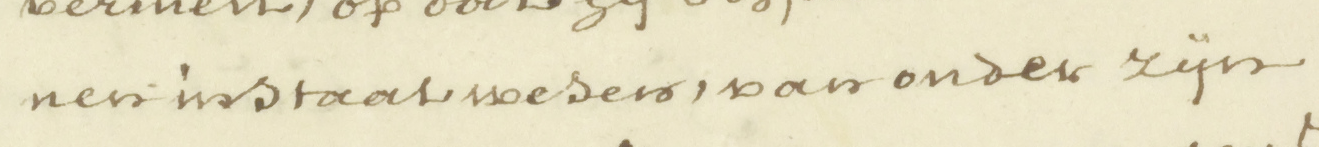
nen in staat wesen, van onder zijn
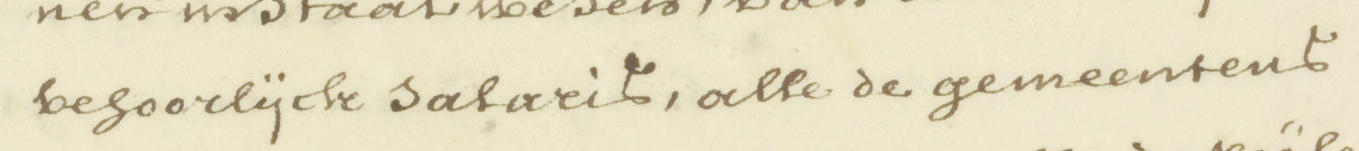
behoorlijck salaris, alle de gemeentens
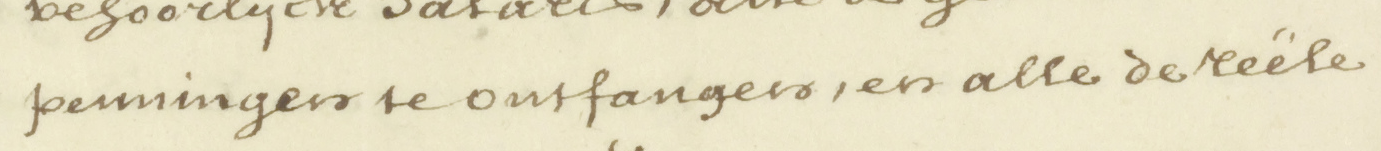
penningen te ontfangen, en alle de reële
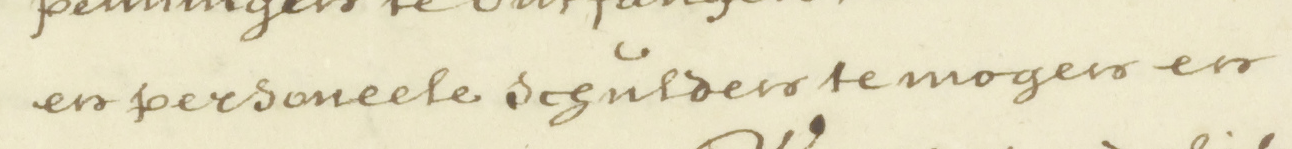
en personeele schulden te mogen en
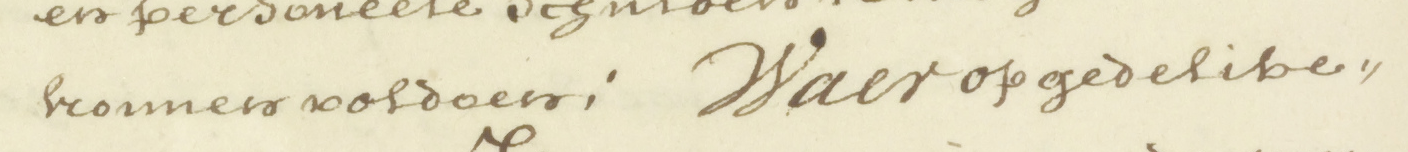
konnen voldoen: Waerop gedelibe„
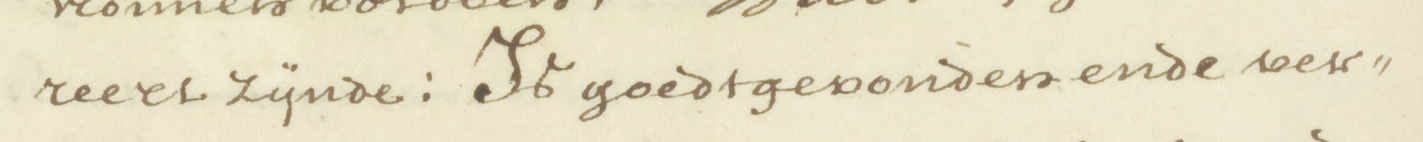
reert zijnde: Is goedtgevonden ende ver„
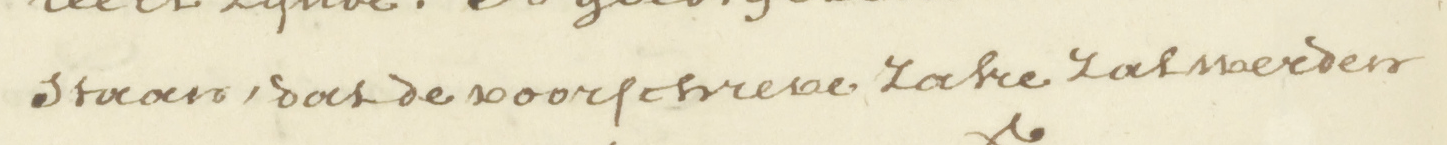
staan, dat de voorschreve zake zal werden
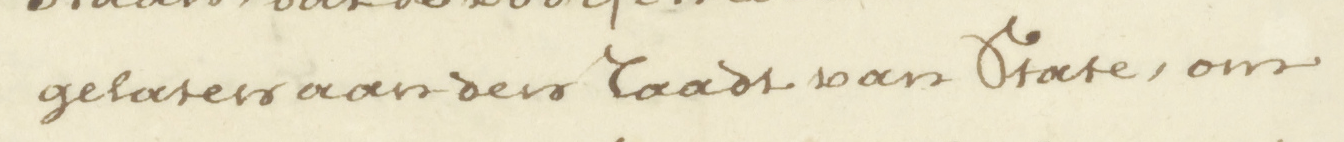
gelaten aan den raadt van State, om
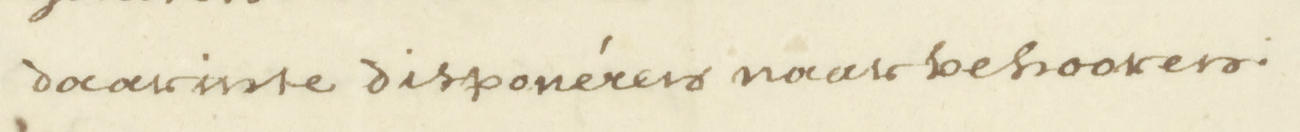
daarin te disponeren naar behooren.
